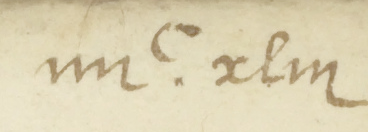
iiiic xliii
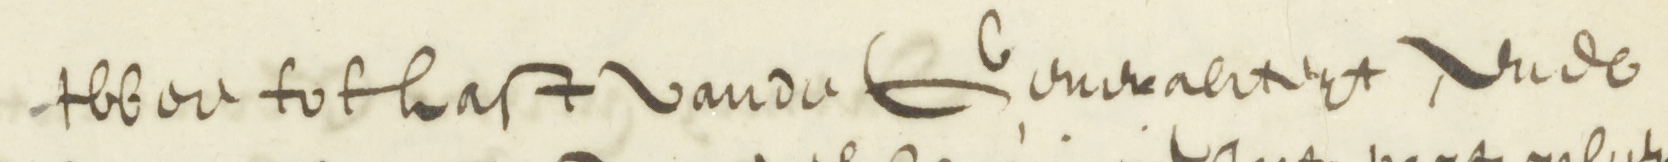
twee tot last vande Generaliteyt ende
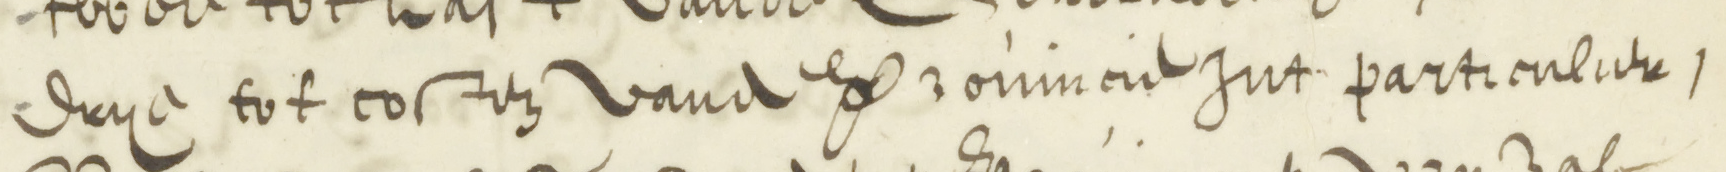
drye tot costen vande prouincie int particulier,
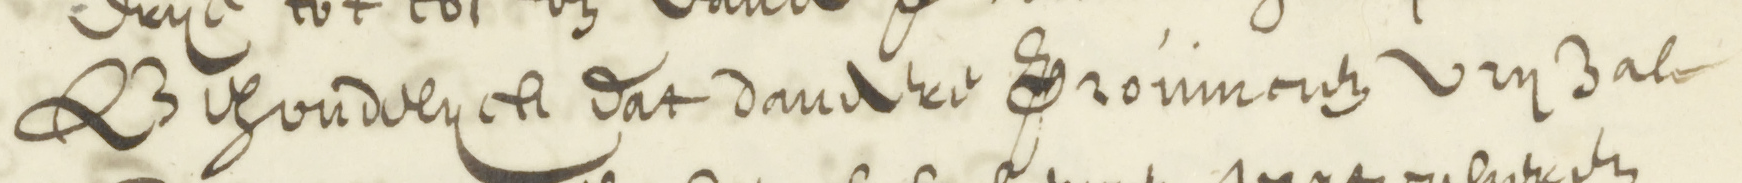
Behoudelyck dat dandere prouincien vrij zal
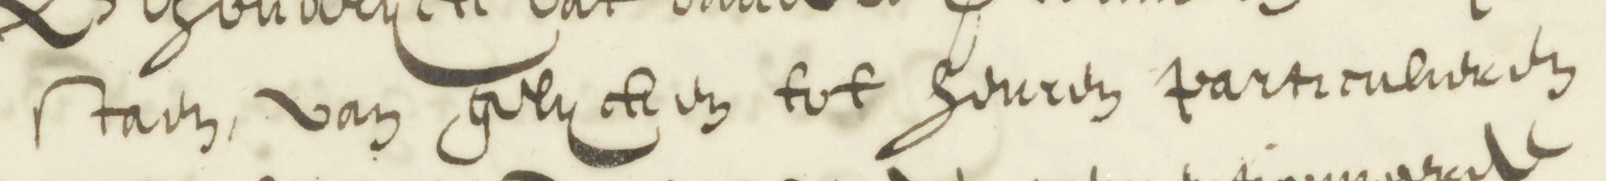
staen van gelycken tot heuren particulieren
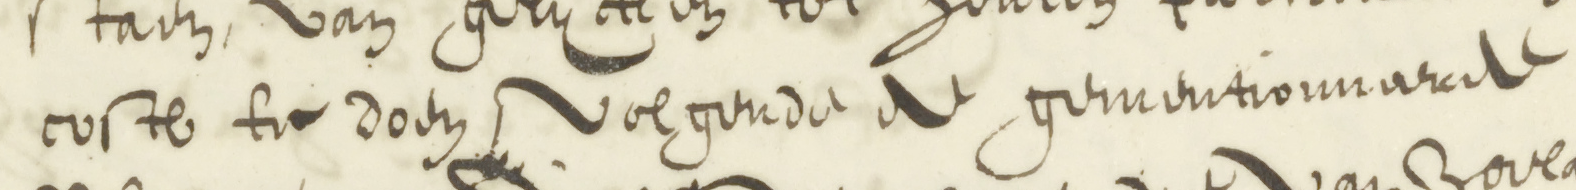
cost te doen, volgende de gementionneerde
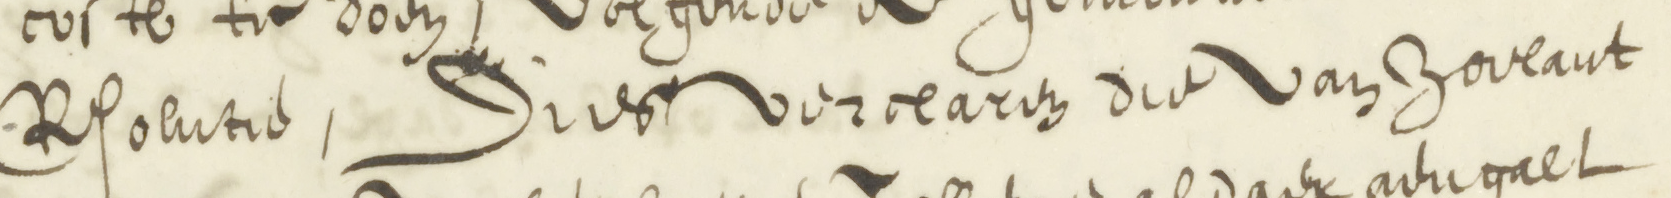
Resolutie. Dies verclaren die van Zeelant
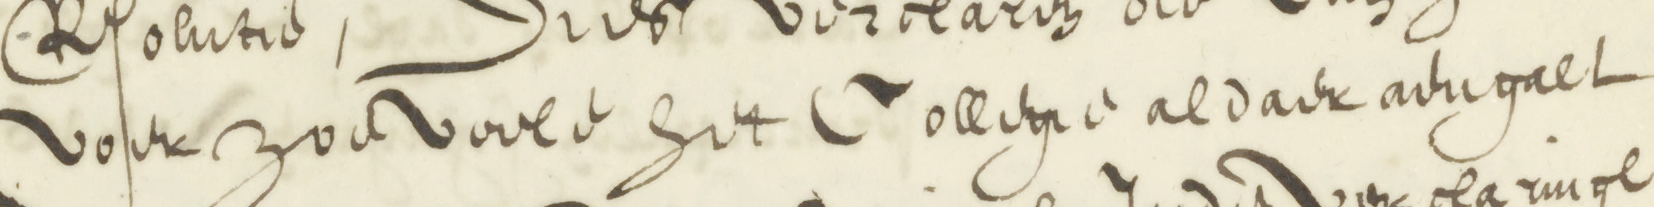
voer zoe veele het Collegie aldaer aengaet
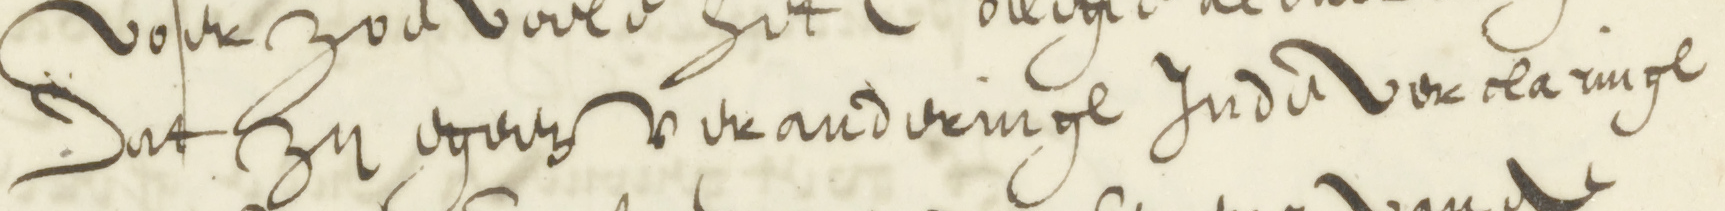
dat zij egeen veranderinge inde verclaringh
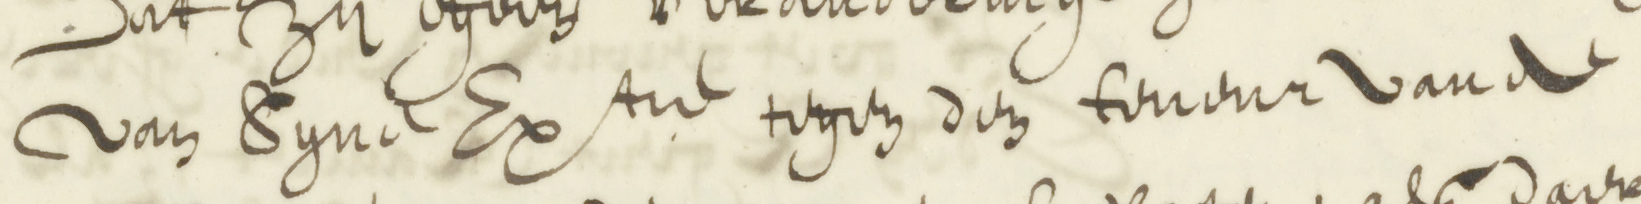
van Sijne Extie tegen den teneur vande
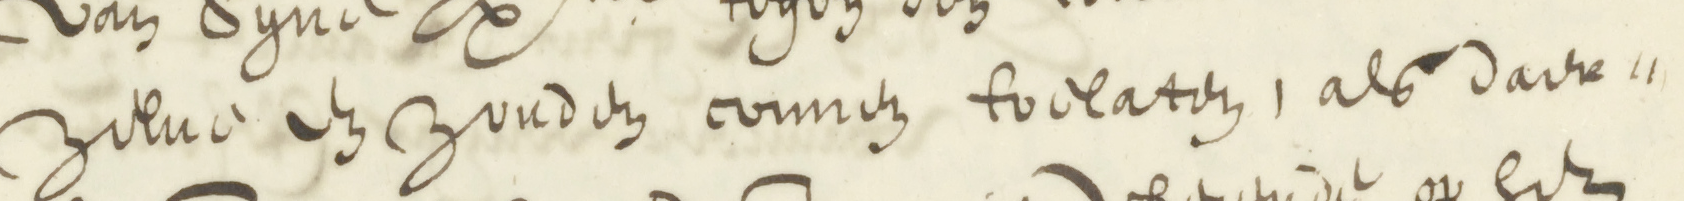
zelue en zouden connen toelaten, als daer„
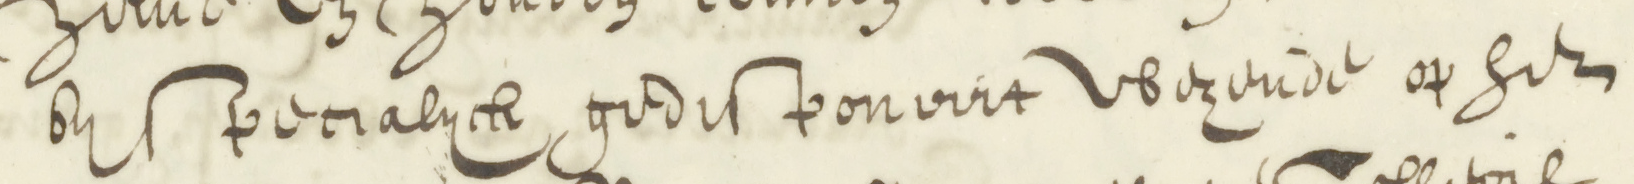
bij specialyck gedisponeert wezende op het
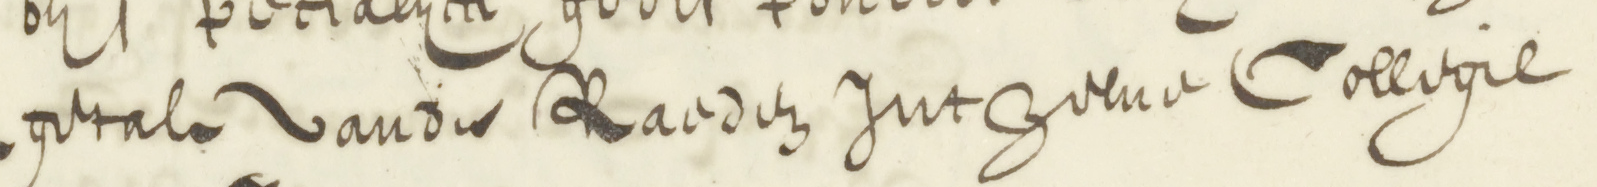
getal van de Raeden int zelve Collegie
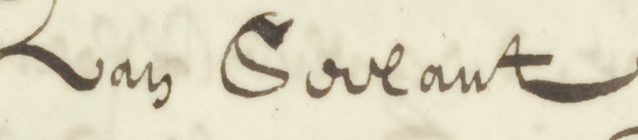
van Seelant.
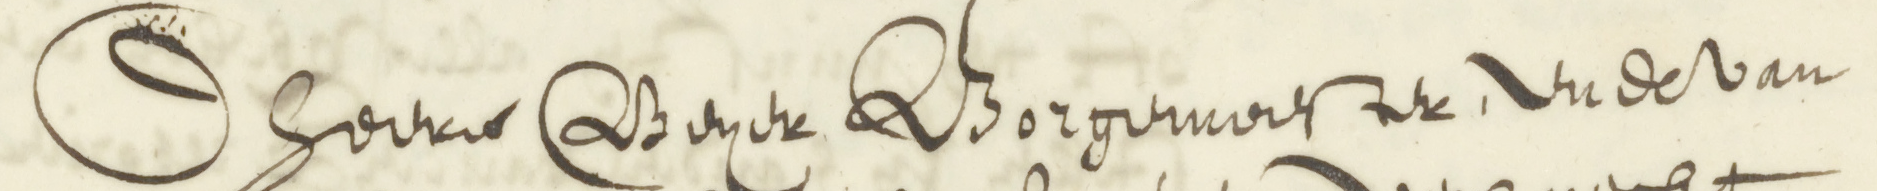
Dheere Beyer borgemeester ende van
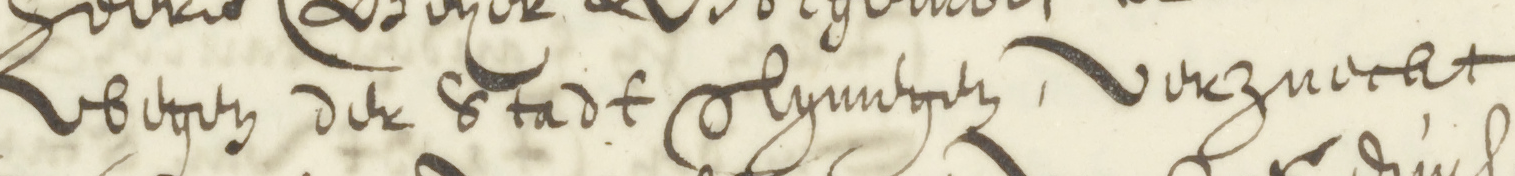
wegen der stadt Nijmegen, verzueckt
